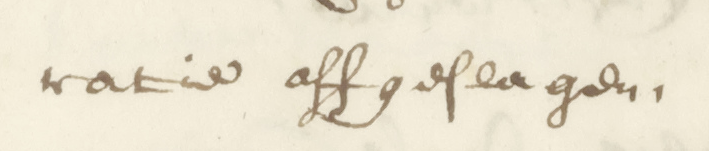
ratie affgeslagen.
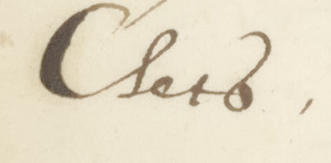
Clets.
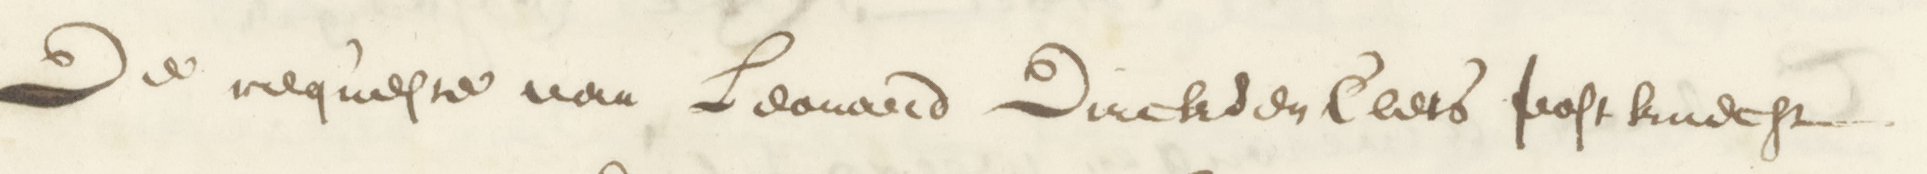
De requeste van Leonard Dircksen Clets postknecht
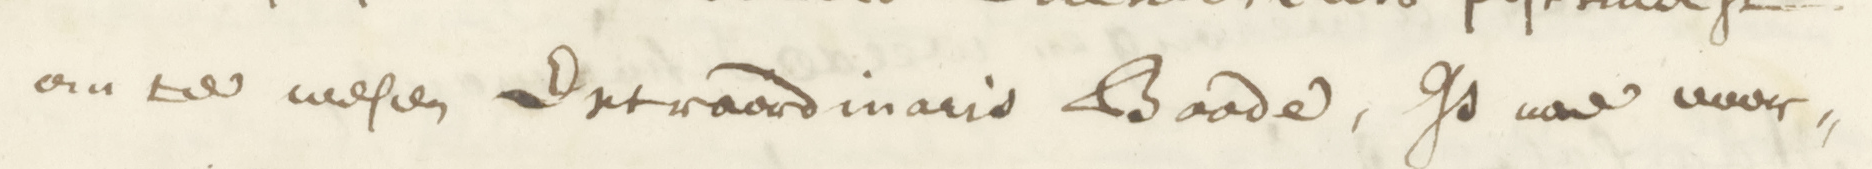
om te wesen Extraordinaris Boode, Is nae voor„
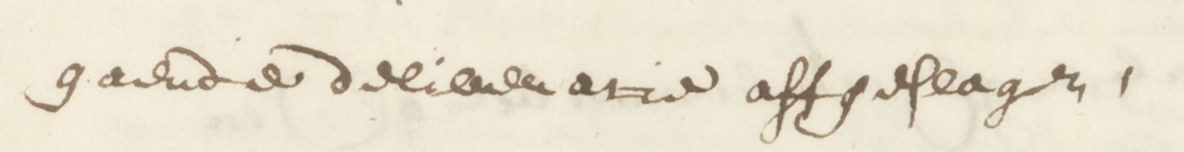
gaende deliberatie affgeslagen.
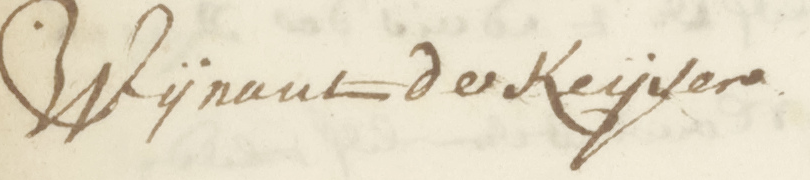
Wijnant de Keijser
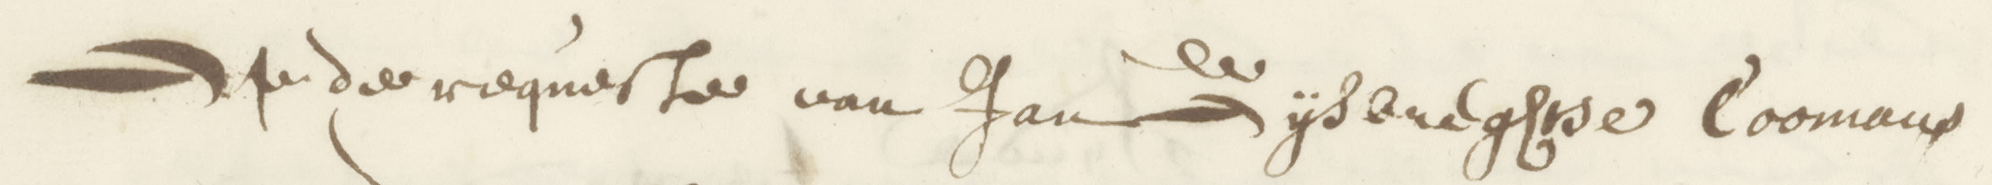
Op de requeste van Jan Gijsbreghtse Coomans
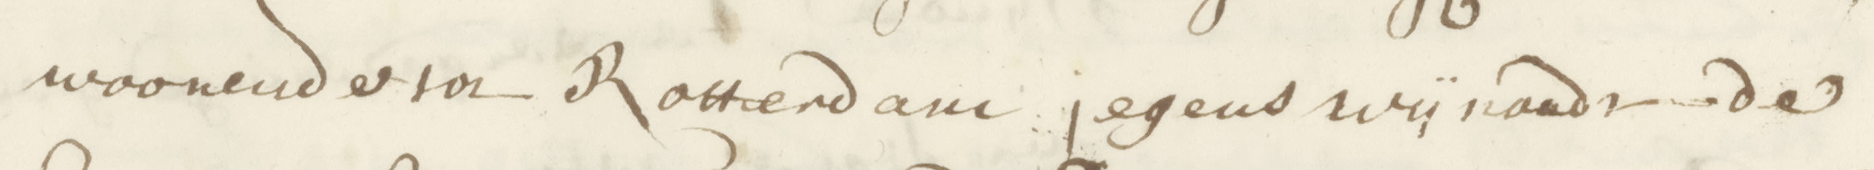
woonende tot Rotterdam: jegens wijnandt de
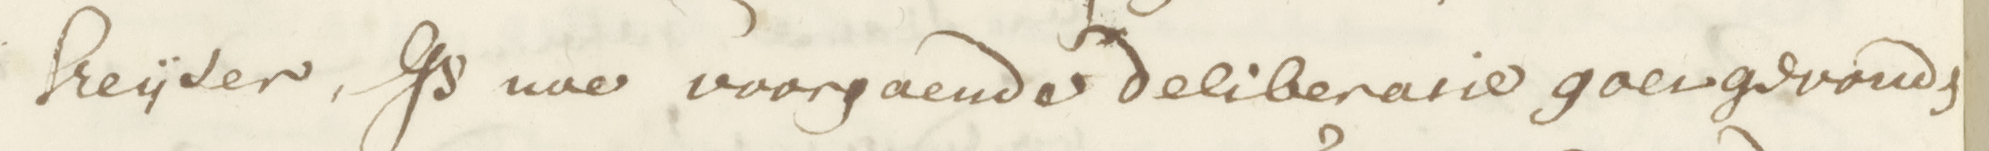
keijser, Is nae voorgaende deliberatie goetgevonden
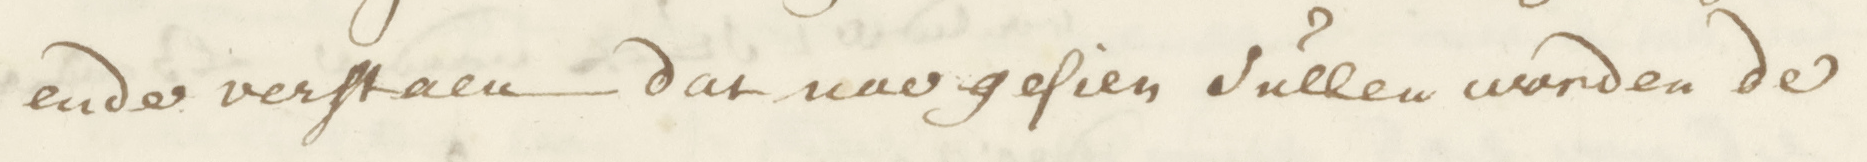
ende verstaen dat nae gesien sullen worden de
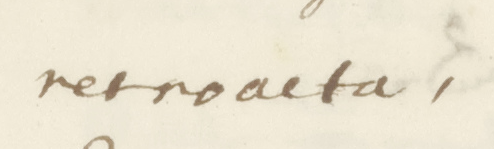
retroacta.
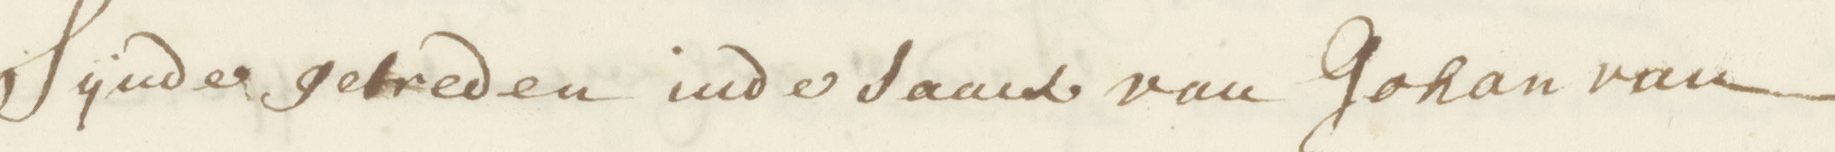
Sijnde getreden inde saack van Johan van
